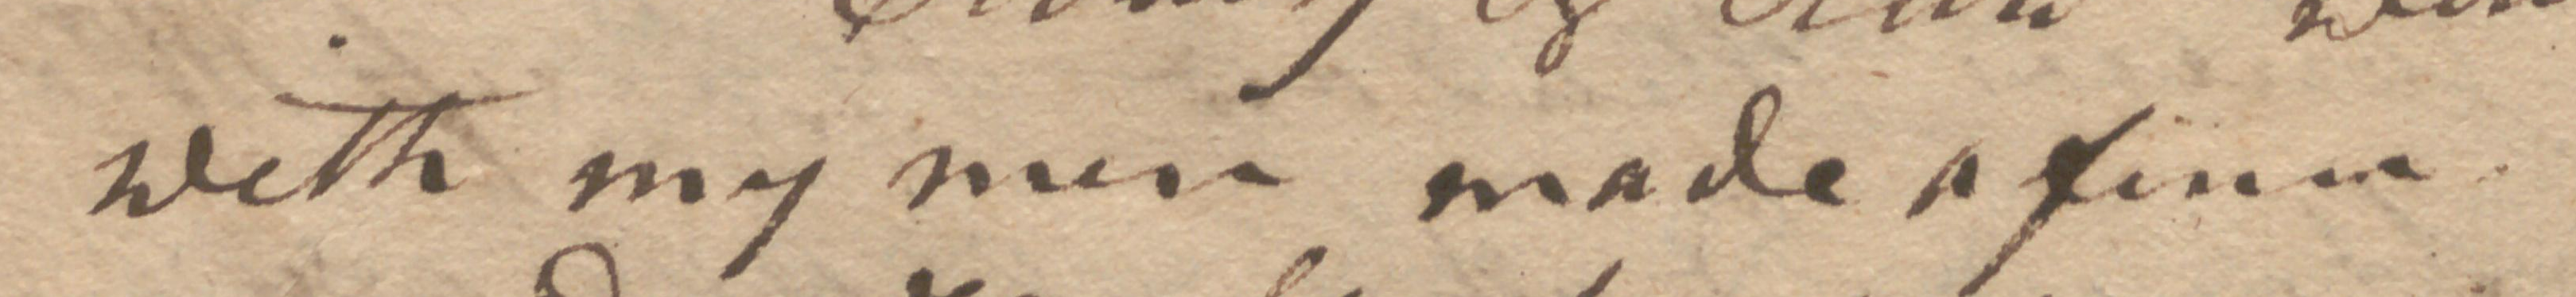with my men made a fence
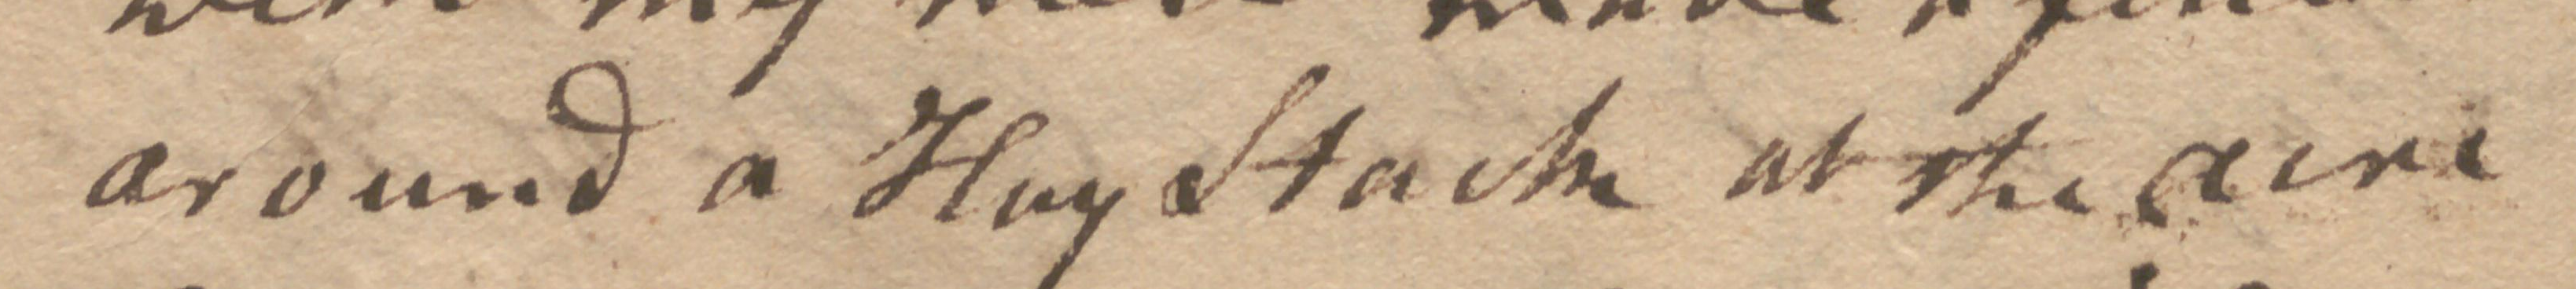around a Hay Stack at the acre
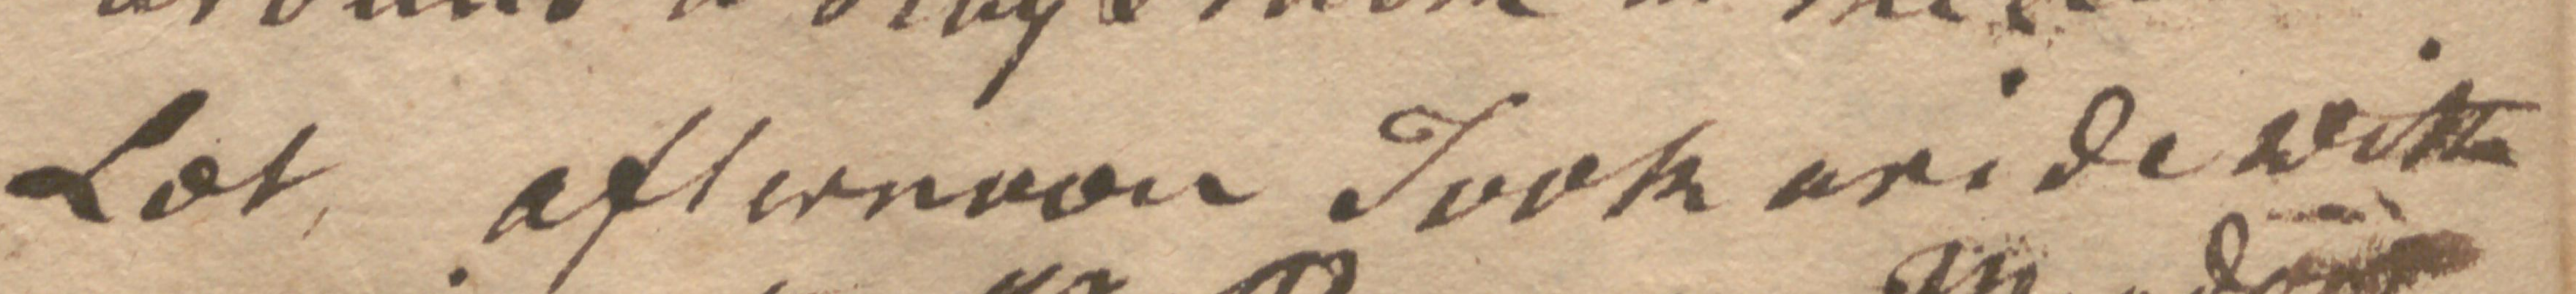Lot, afternoon Took a ride with
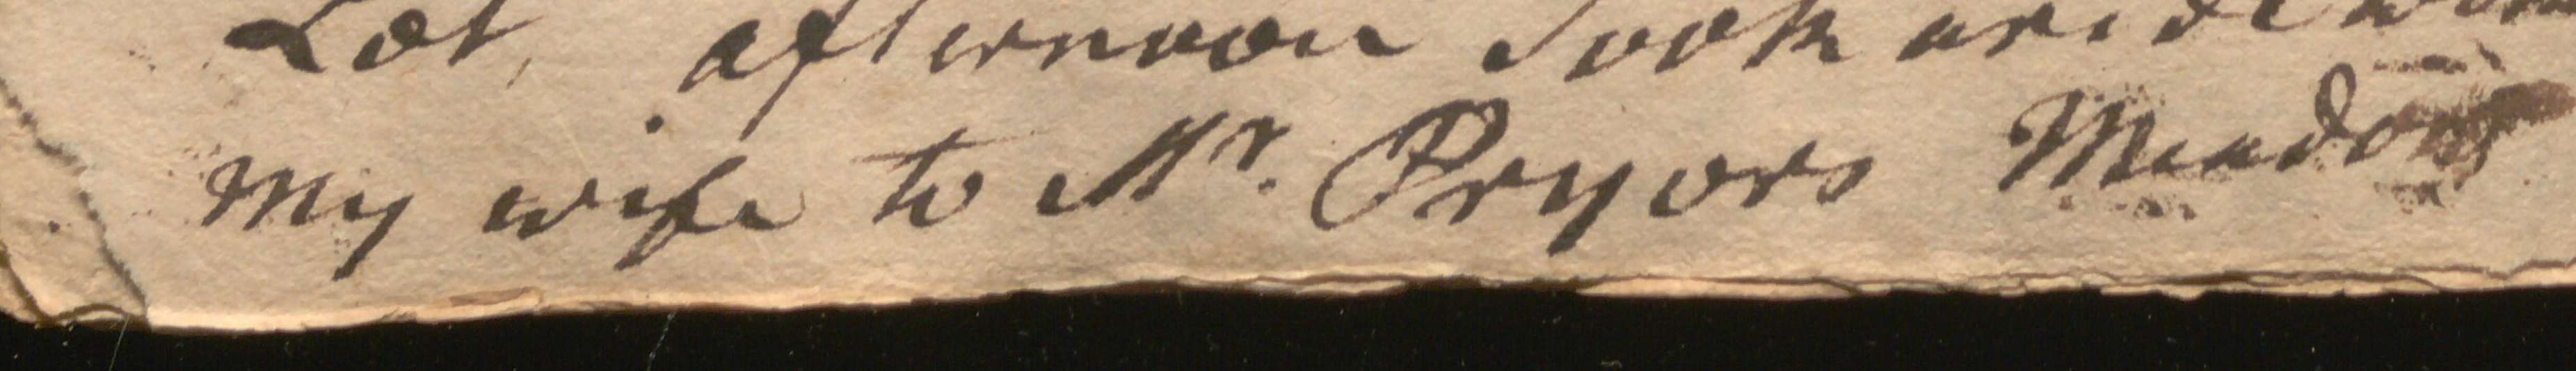my wife to M^r. Pryors Meadow
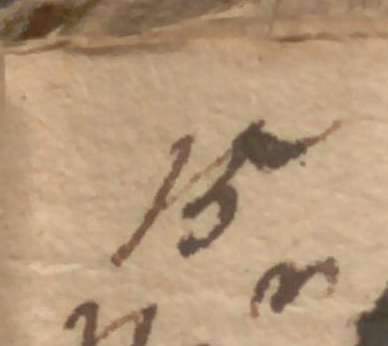15
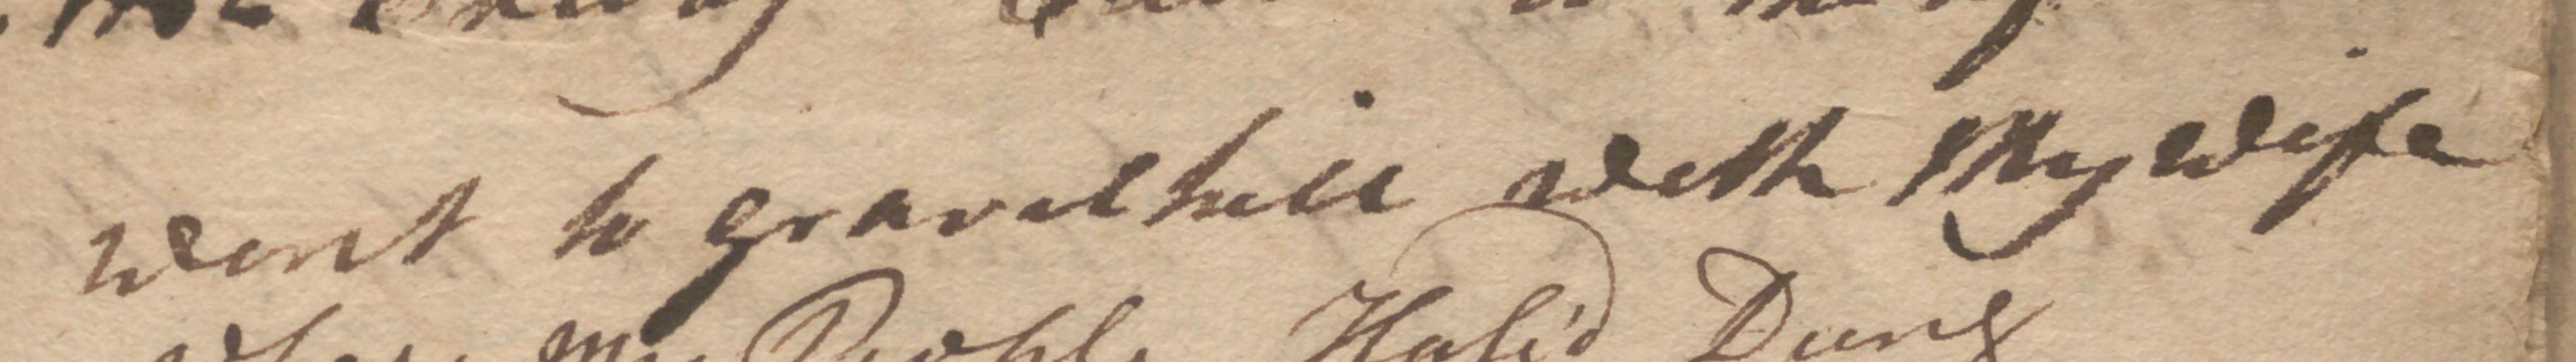went to gravelhill with My wife
